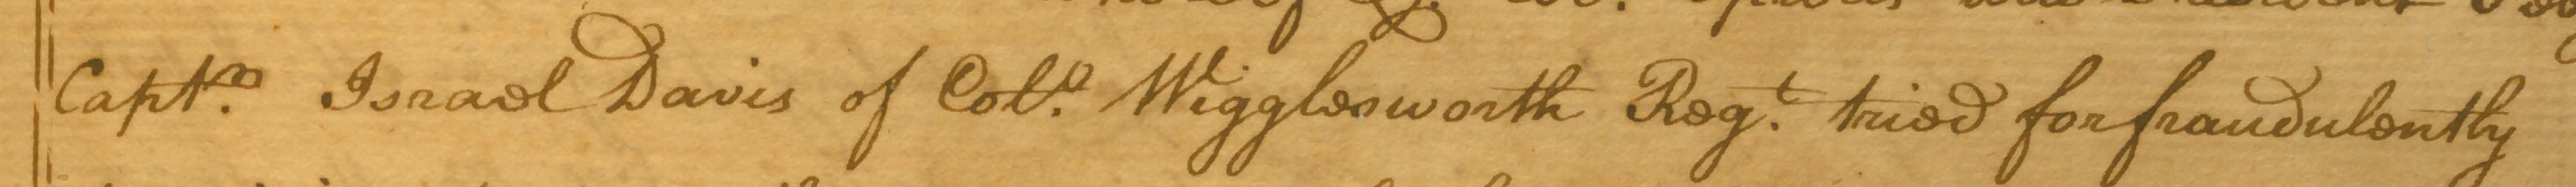Capt^n. Israel Davis of Col^o. Wigglesworth Reg^t. tried for fraudulently
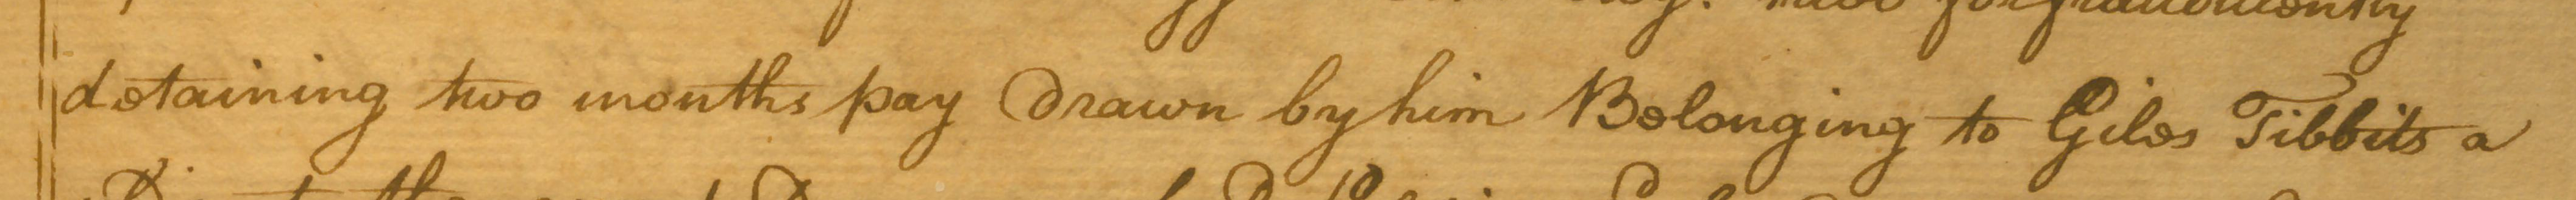detaining two months pay drawn by him Belonging to Giles Tibbits a
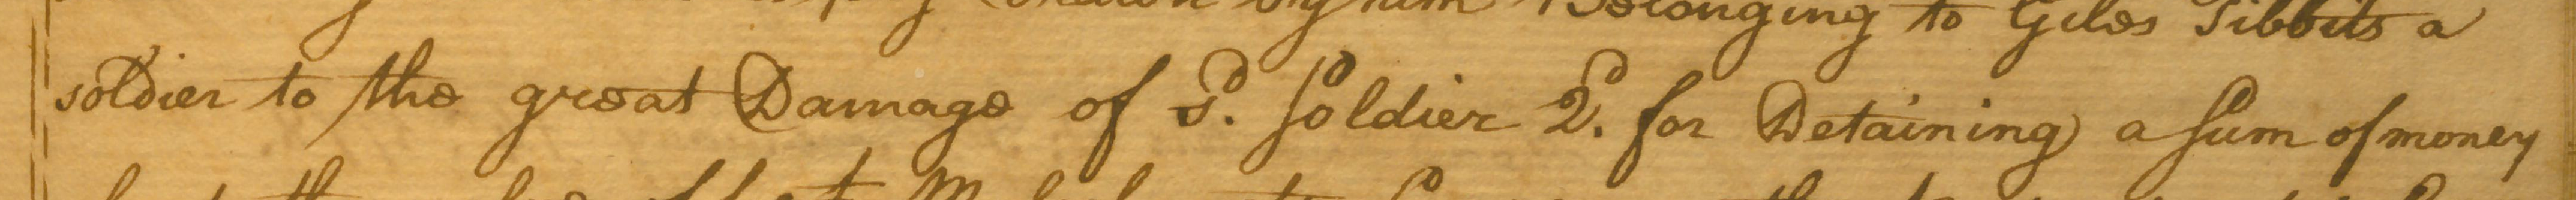soldier to the great Damage of s^d. soldier 2^d. for Detaining a sum of money
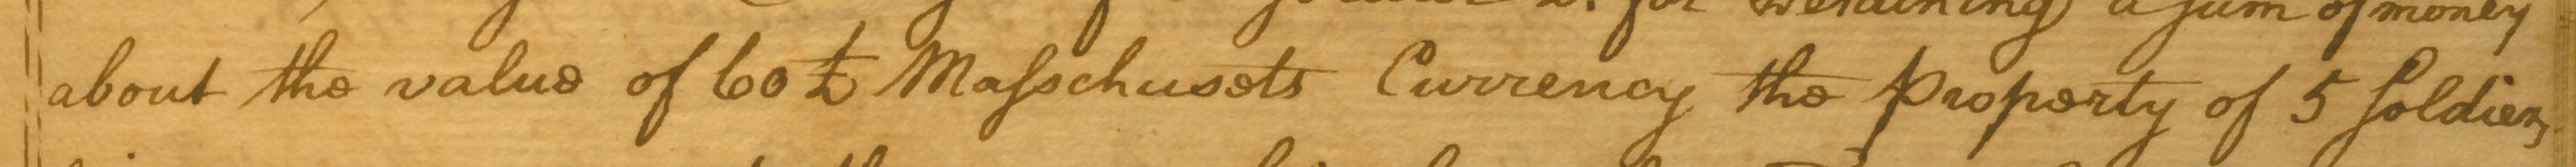about the value of 60 £ Masschusets Currency the property of 5 soldiers
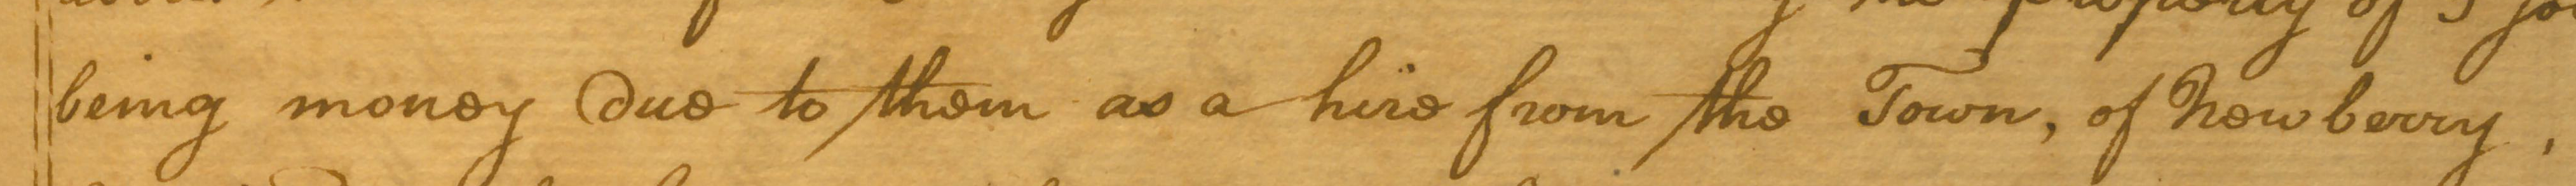being money due to them as a hire from the Town, of Newberry
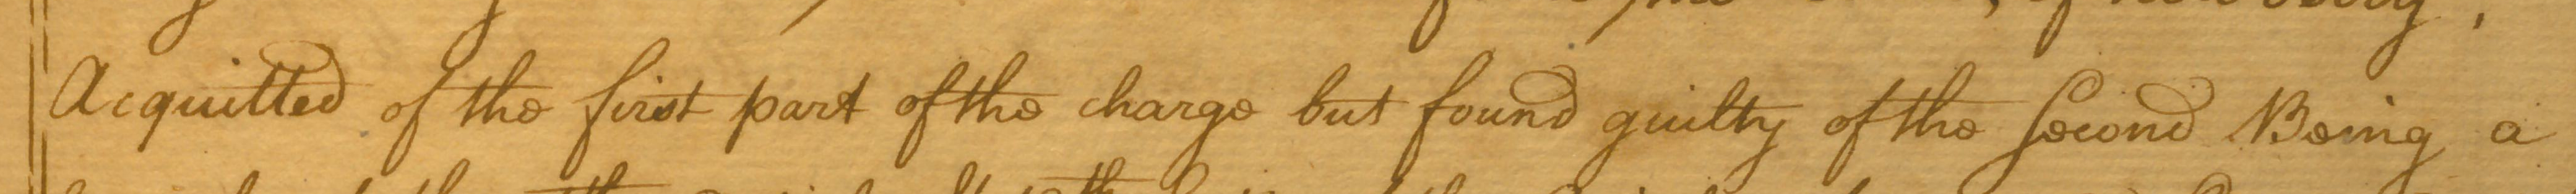Acquitted of the first part of the charge but found guilty of the second Being a
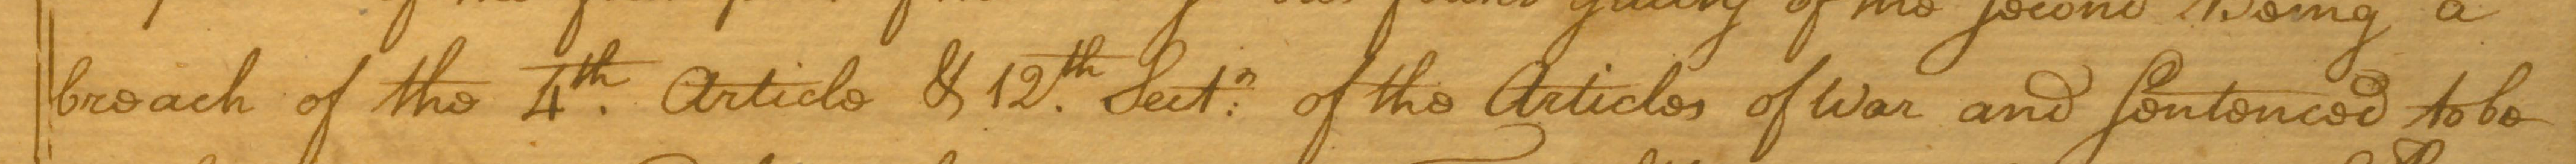breach of the 4^th. Article & 12^th. Sect^n: of the Articles of war and sentenced to be
